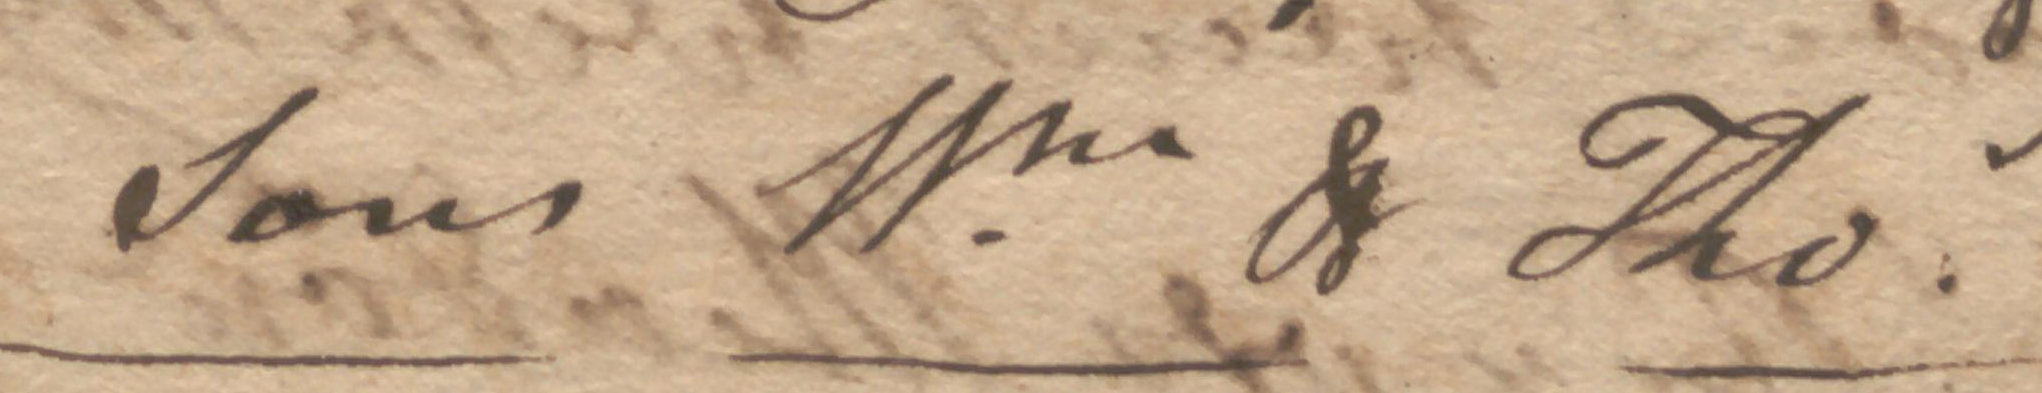Sons W^m. & Tho^s.
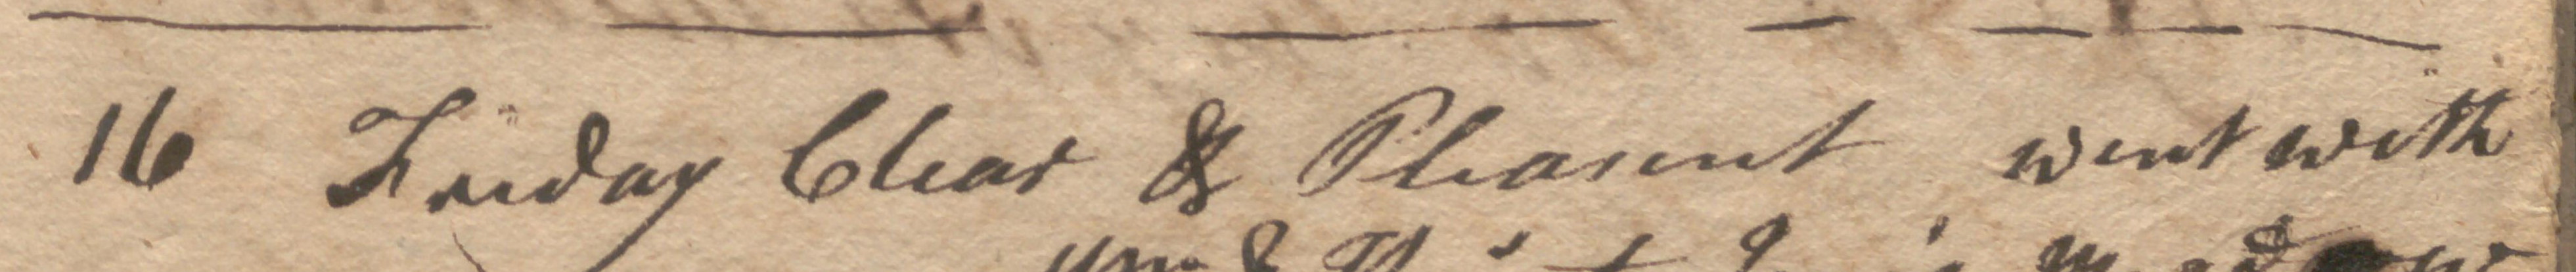16 Friday Clear & Pleasent went with
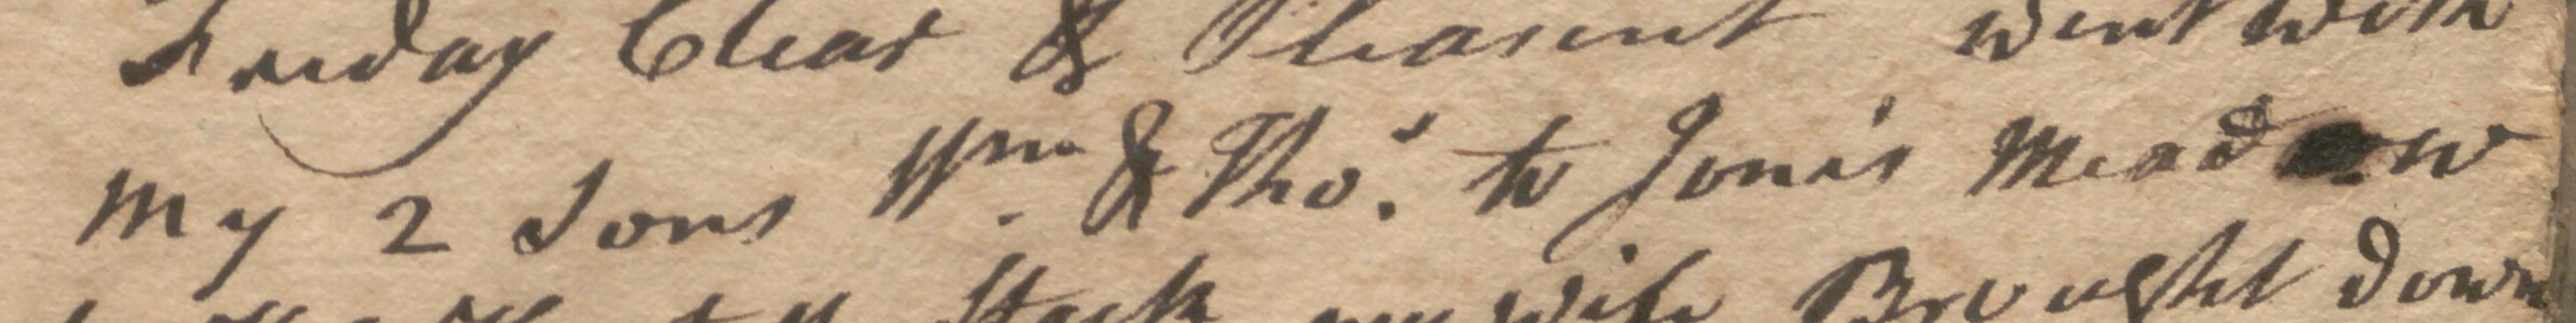my 2 sons W^m. & Tho^s. to Jone's Meadow
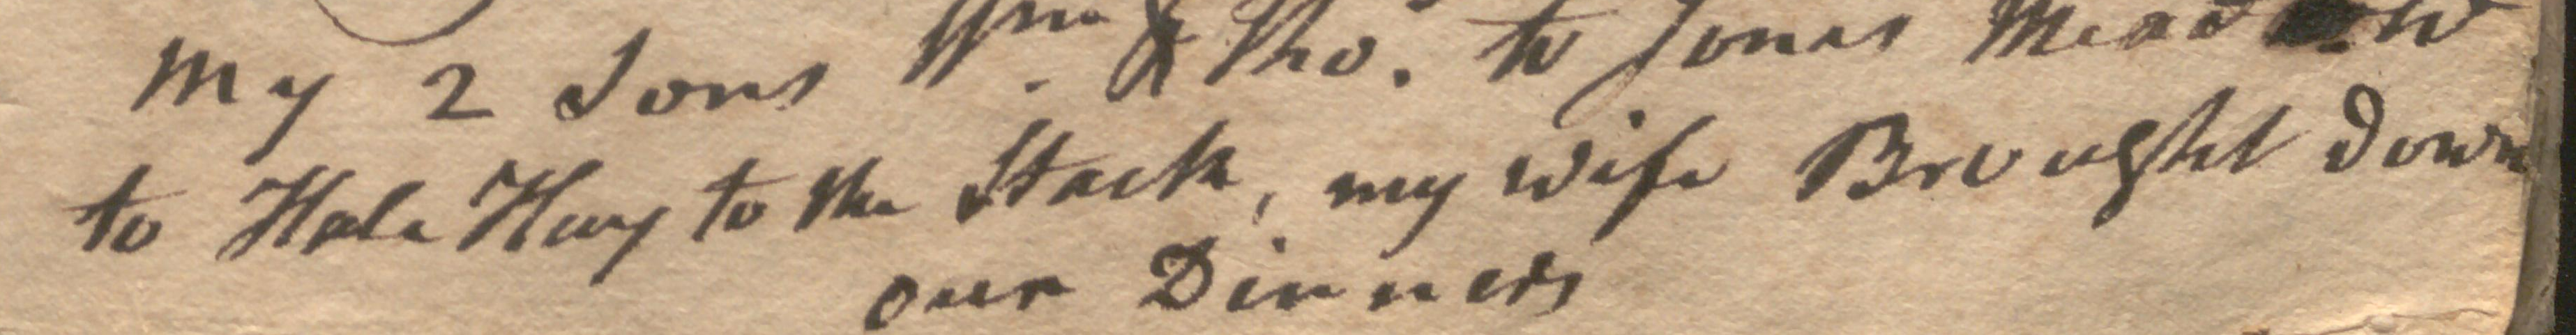to Hale Hay to the Stack, my wife Brought down
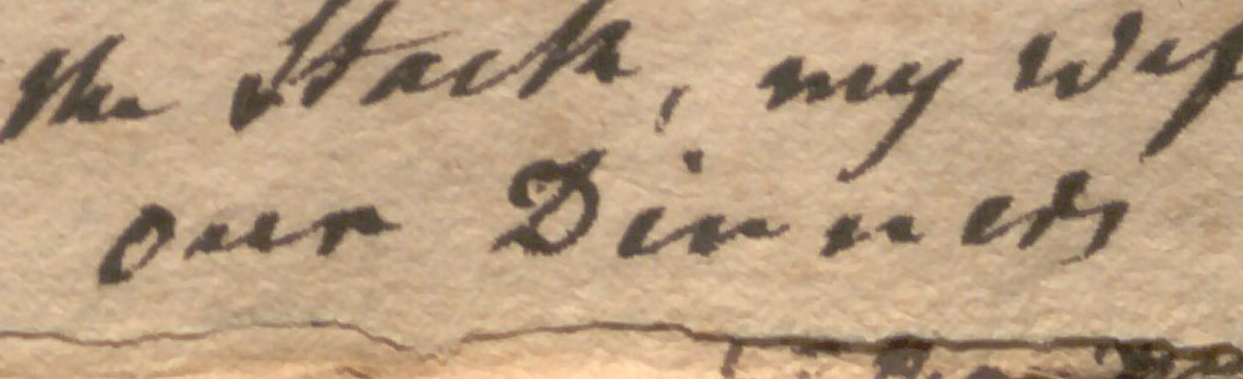our Denners
